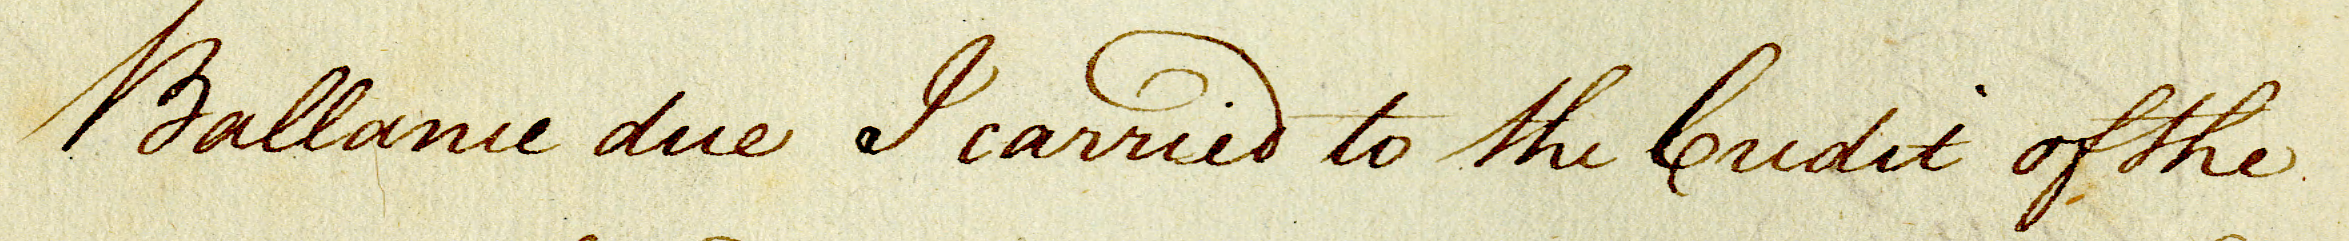Ballance due I carried to the Credit of the
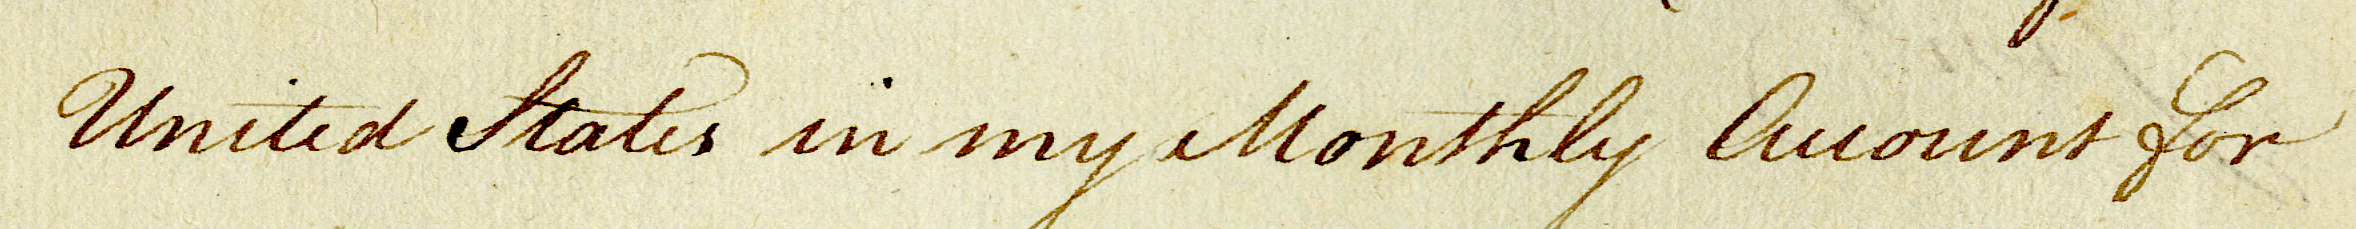United States in my Monthly Account for
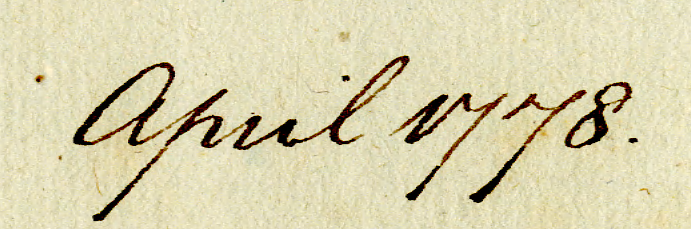April 1778.
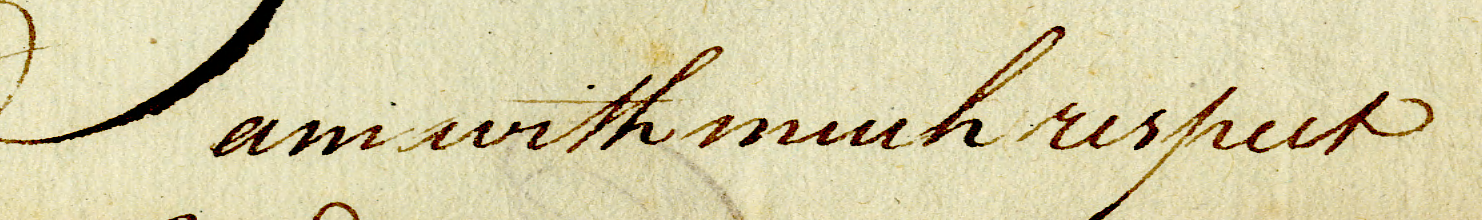I am with much respect
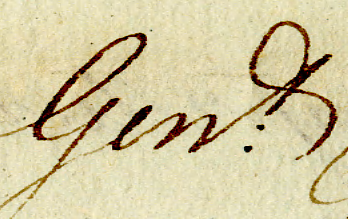Gen^t:
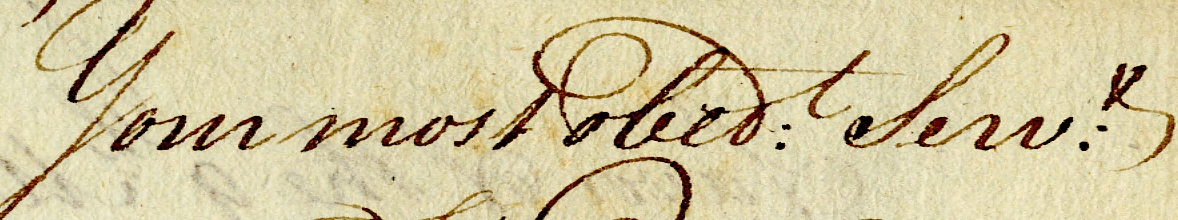Your most obed:^t Serv:^t
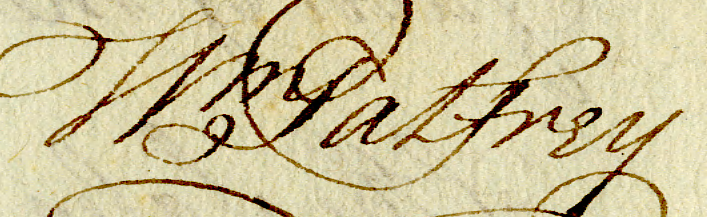Wm Palfrey
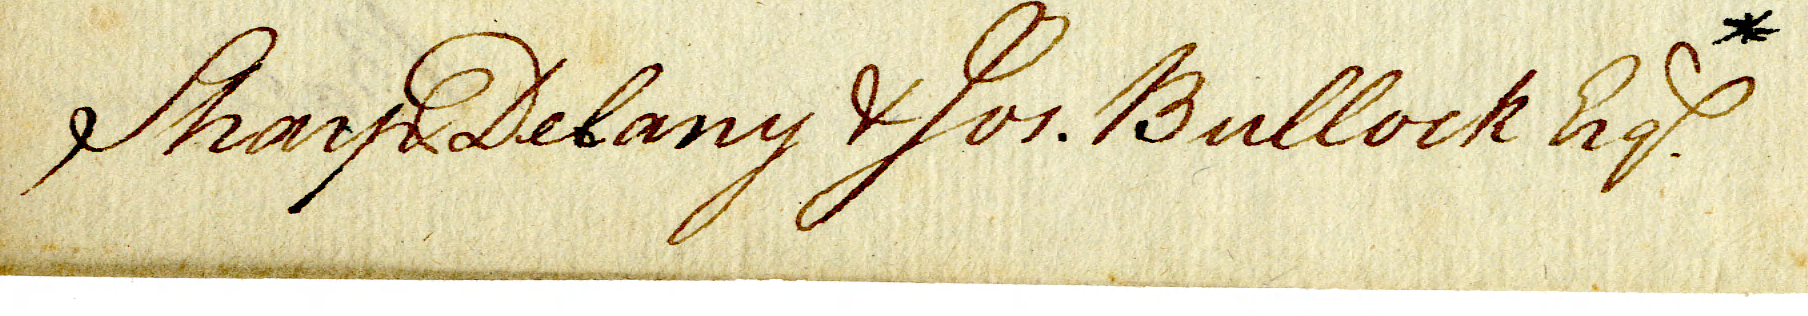Sharp Delany & Jos. Bullock Esq.*
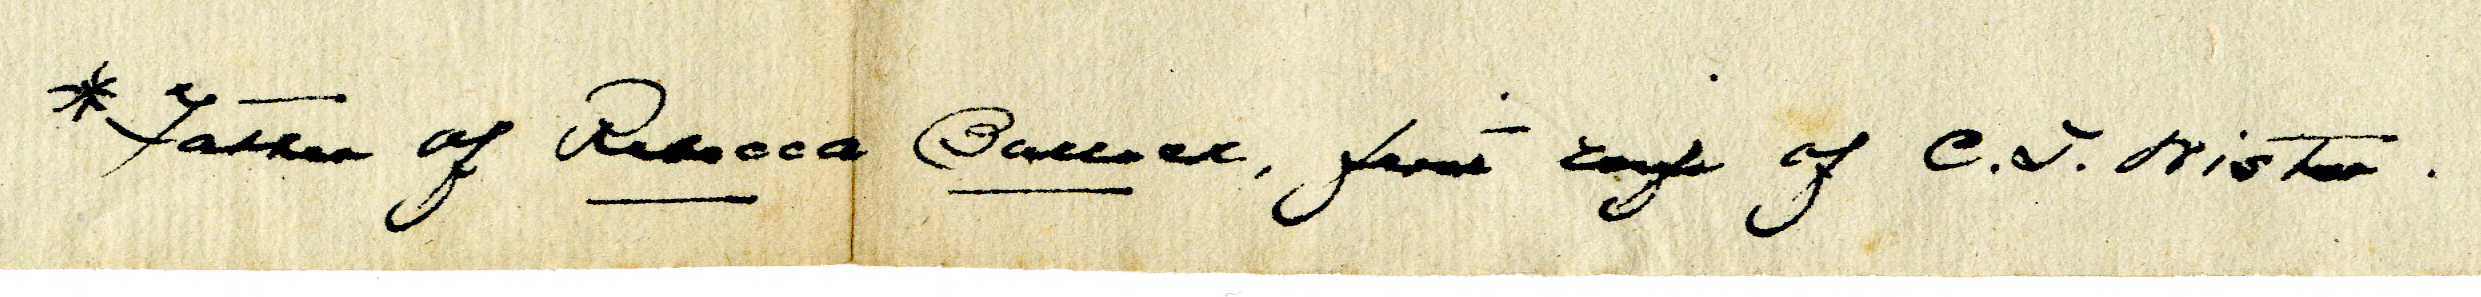Father of Rebecca Bullock, first cousin of C. J. Wister
